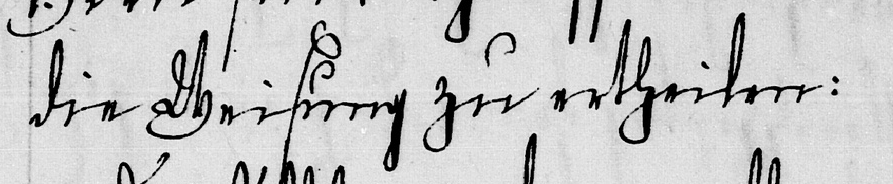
die Weisung zu ertheilen:
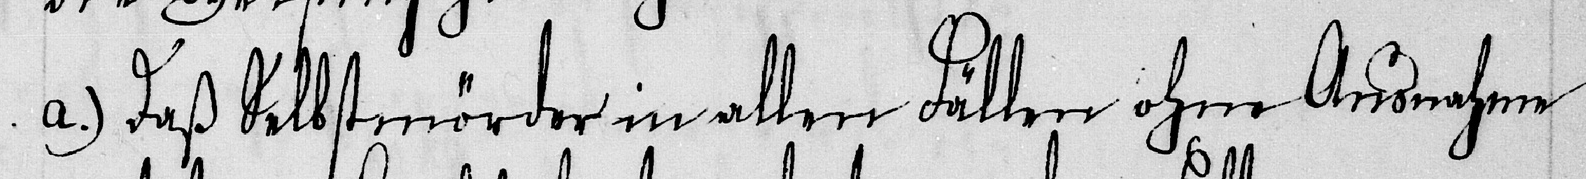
a.) Daß Selbstmörder in allen Fällen ohne Ausnahme
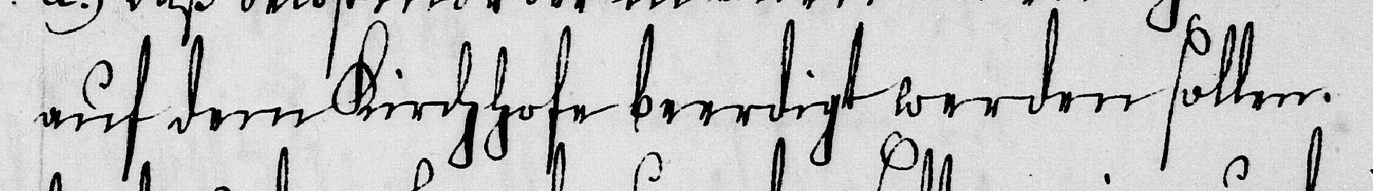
auf dem Kirchhofe beerdigt werden sollen.
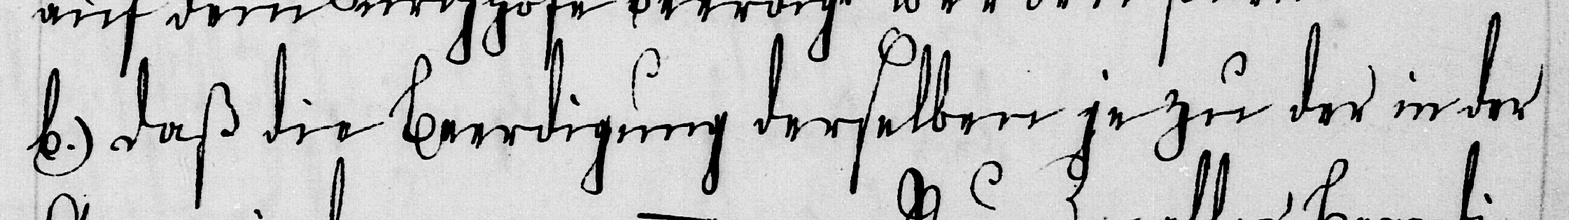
b.) daß die Beerdigung derselben je zu der in der
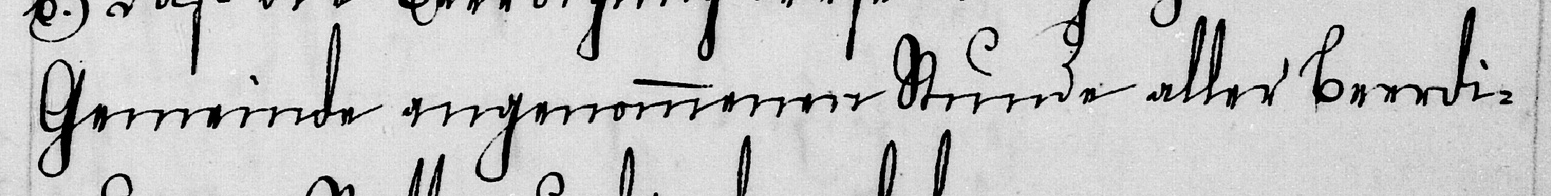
Gemeinde angenommenen Stunde aller Beerdi¬
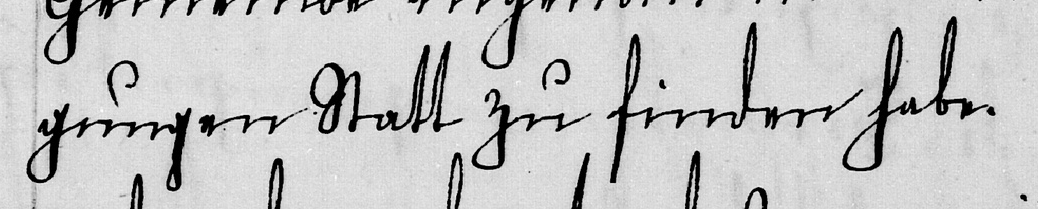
gungen Statt zu finden habe.
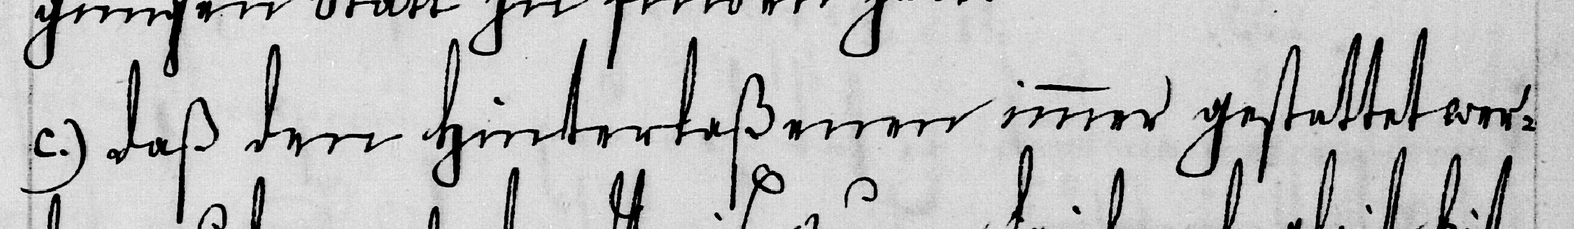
c.) daß den Hinterlaßenen immer gestattet wer¬
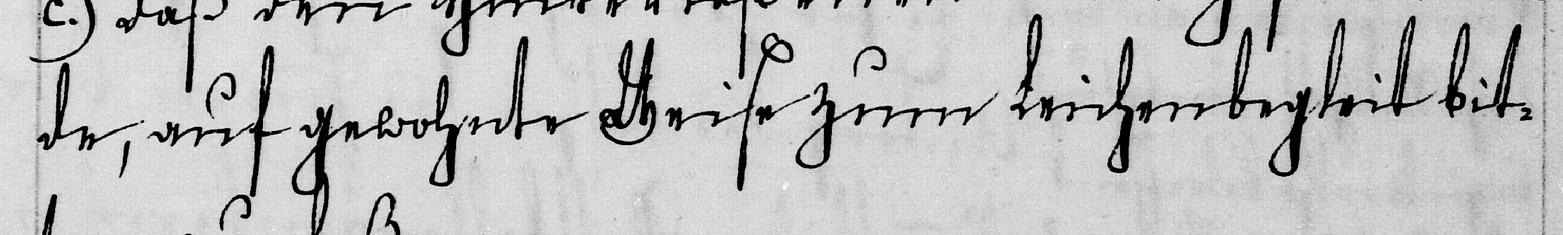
de, auf gewohnte Weise zum Leichenbegleit bit¬
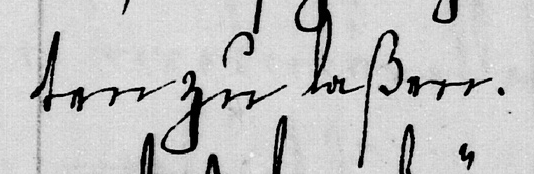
ten zu laßen.
